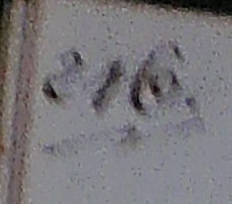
216.
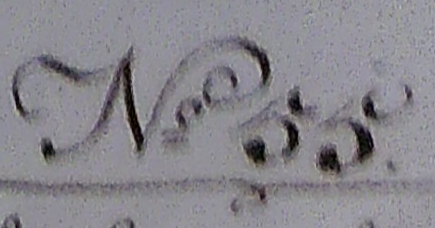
No͇ 55.
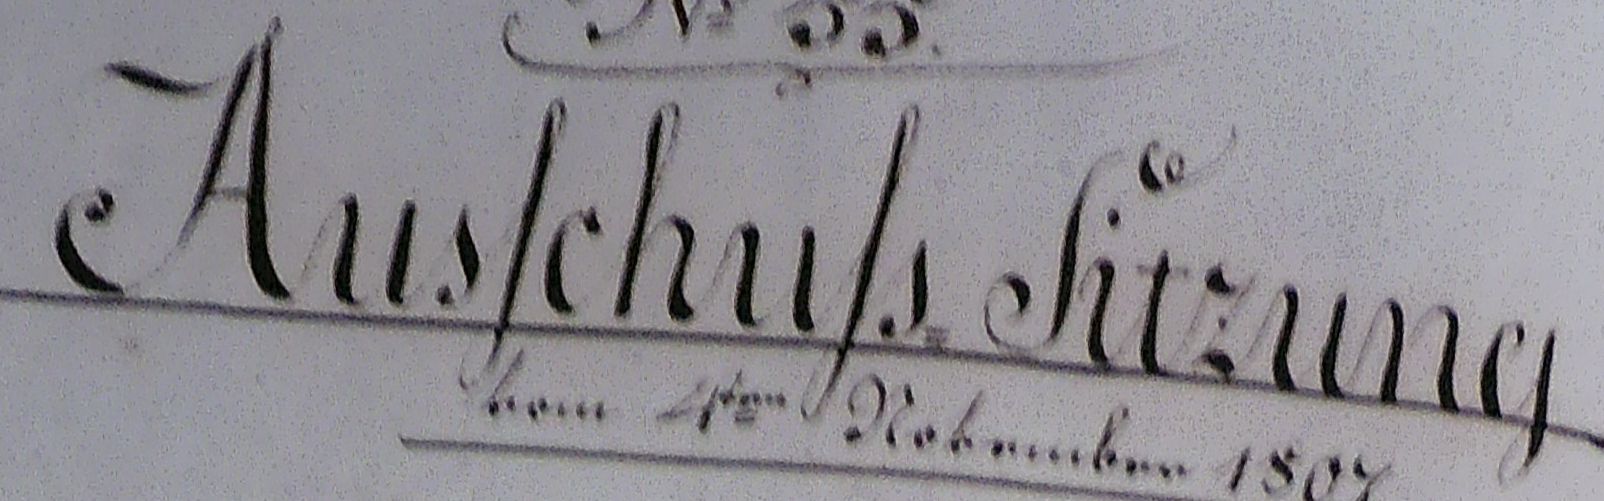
Ausschuss‗Sitzung
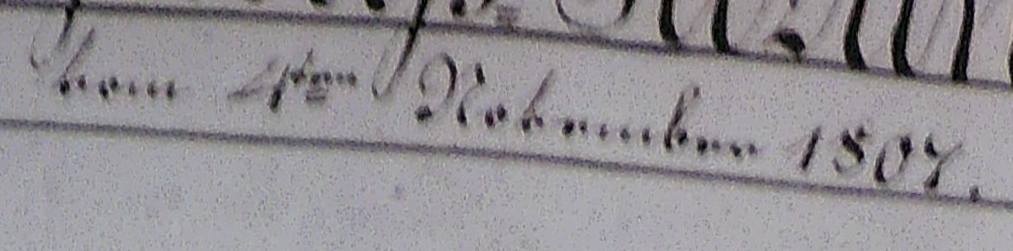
vom 4te͇n November 1807.
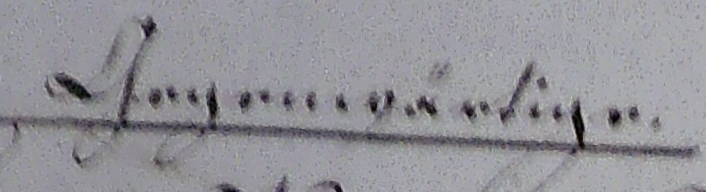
Gegenwärtige.
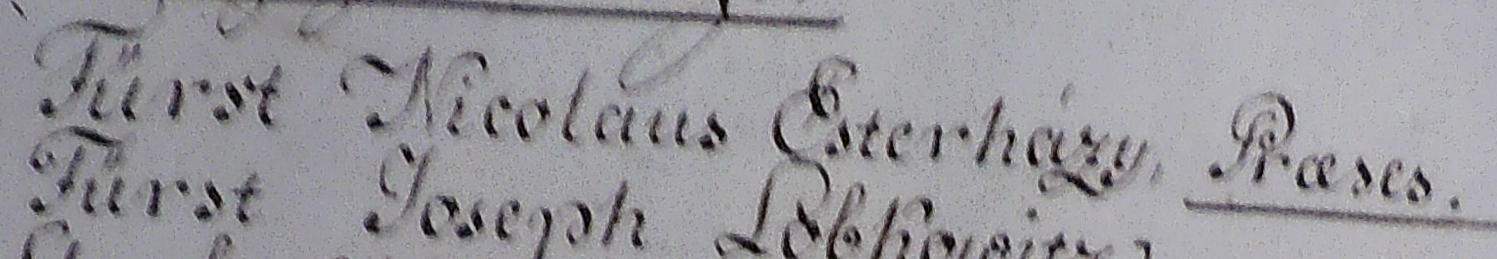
Fürst Nicolaus Esterházy, Præses.
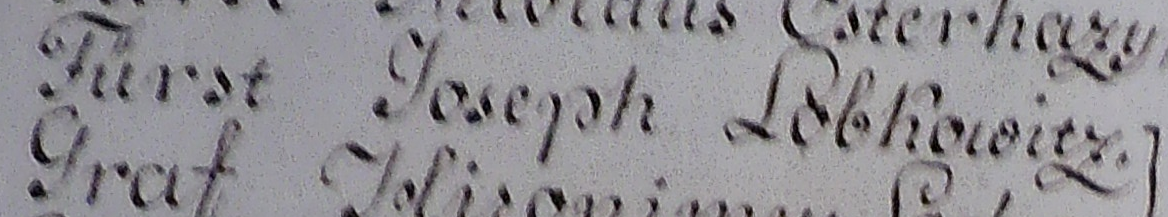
Fürst Joseph Lobkowitz.
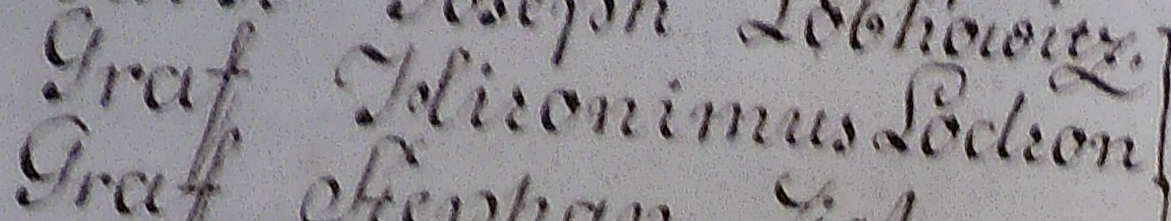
Graf Hironimus Lodron
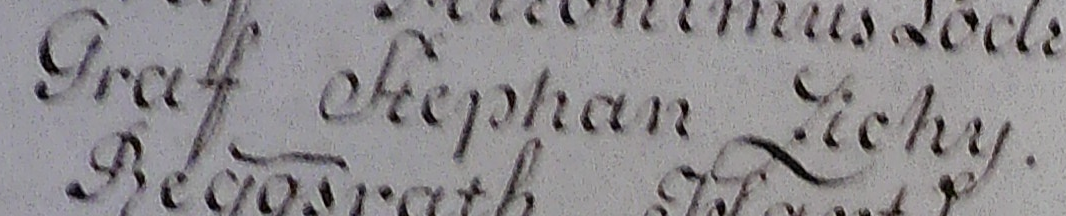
Graf Stephan Zichy.
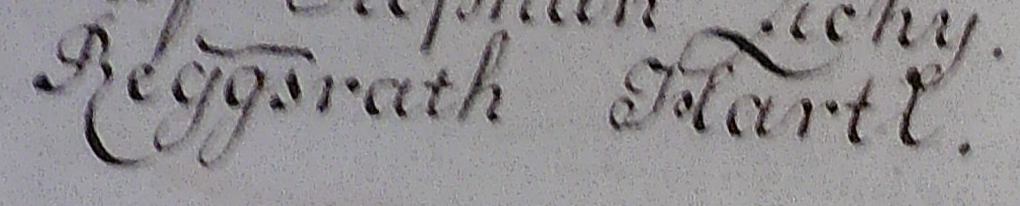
Reg͞gsrath Hartl.
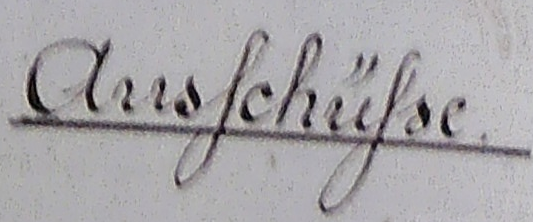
Ausschüsse.
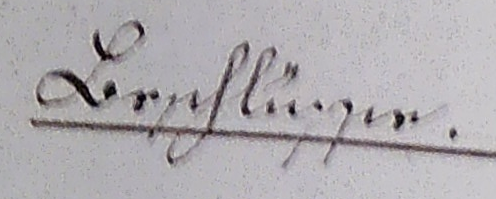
Beschlüsse.
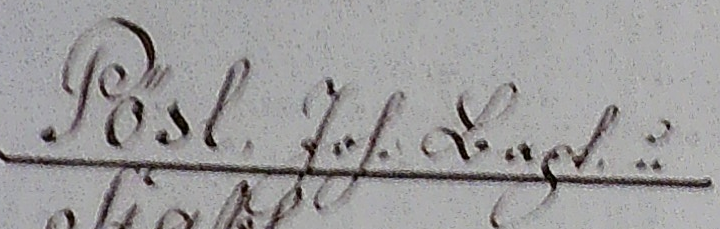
Pösl, Joh. Bapt. u
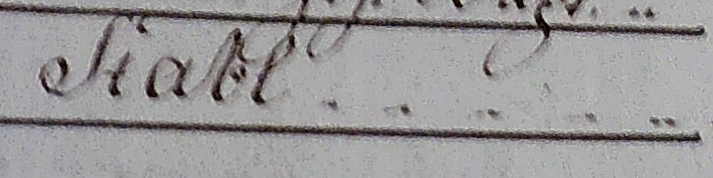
Stabl . . . . ..
